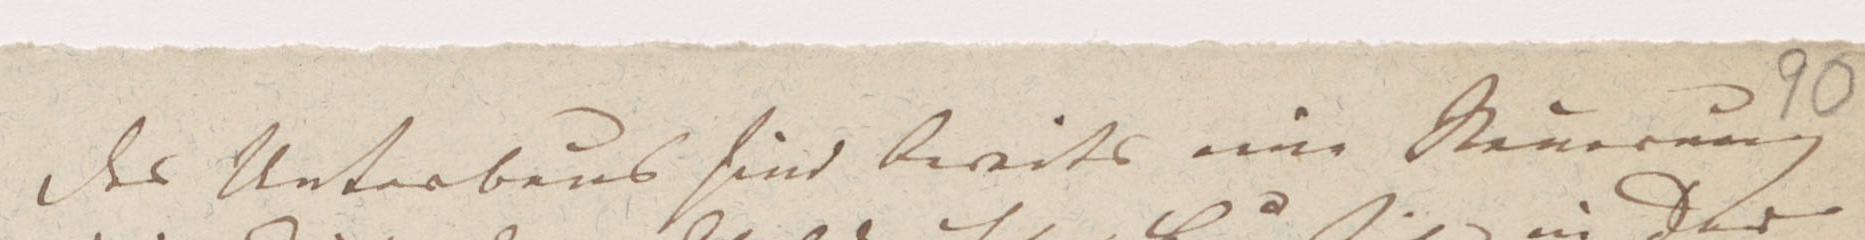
des Unterbaus sind bereits eine Neuerung
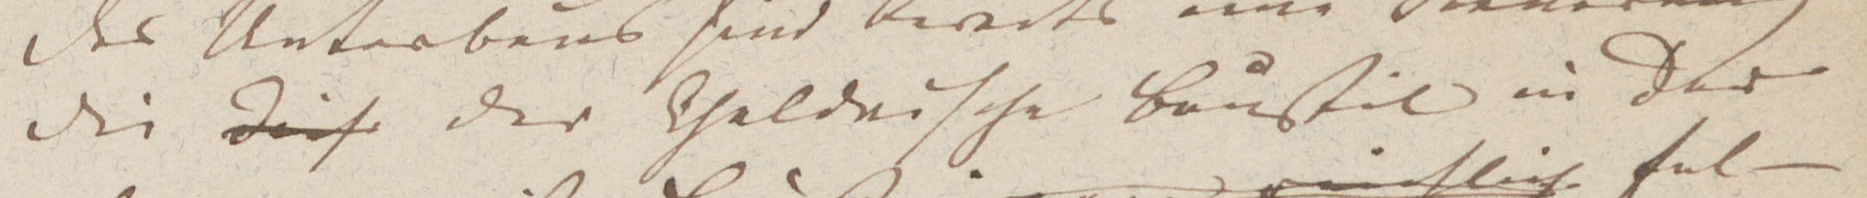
die dies der Chaldäische Baustil in der
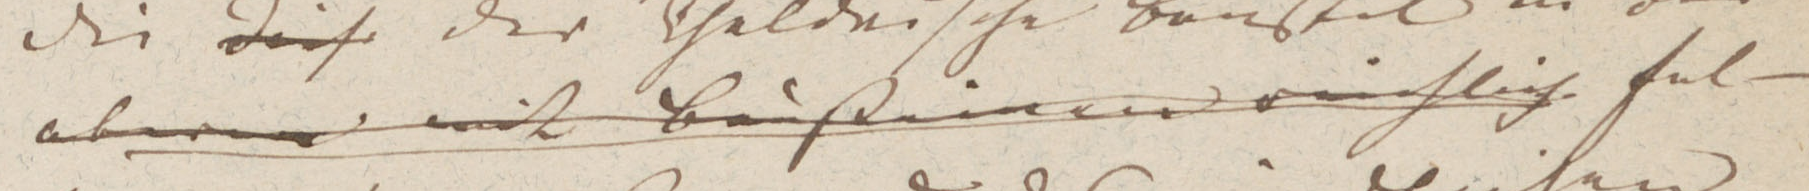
oberen mit Bausteinen reichlich fel-
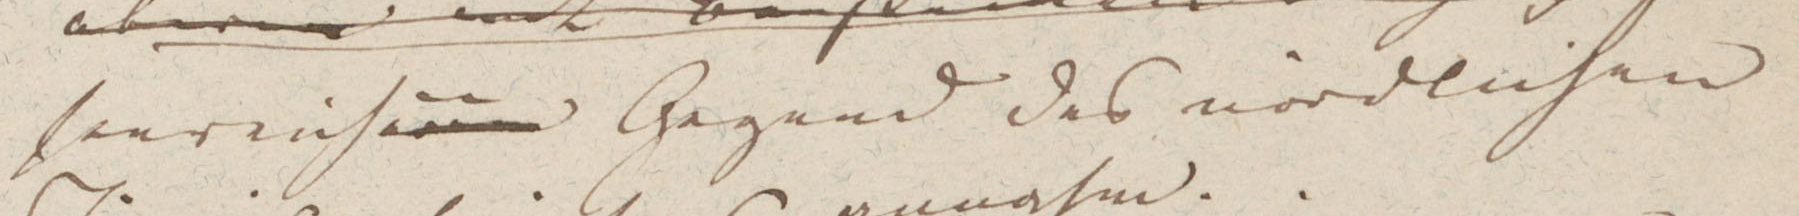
senreicheerenn Gegend des nördlichen
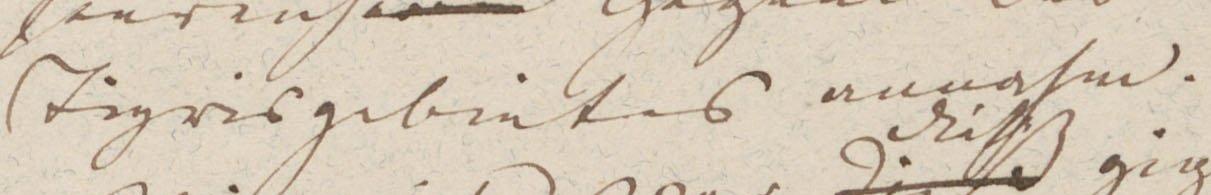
Tigrisgebietes annahm.
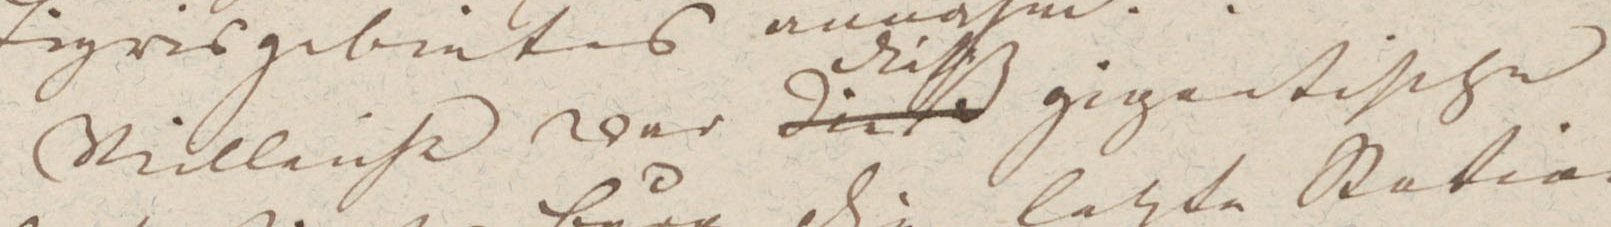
Vielleicht war diess diese gigantische
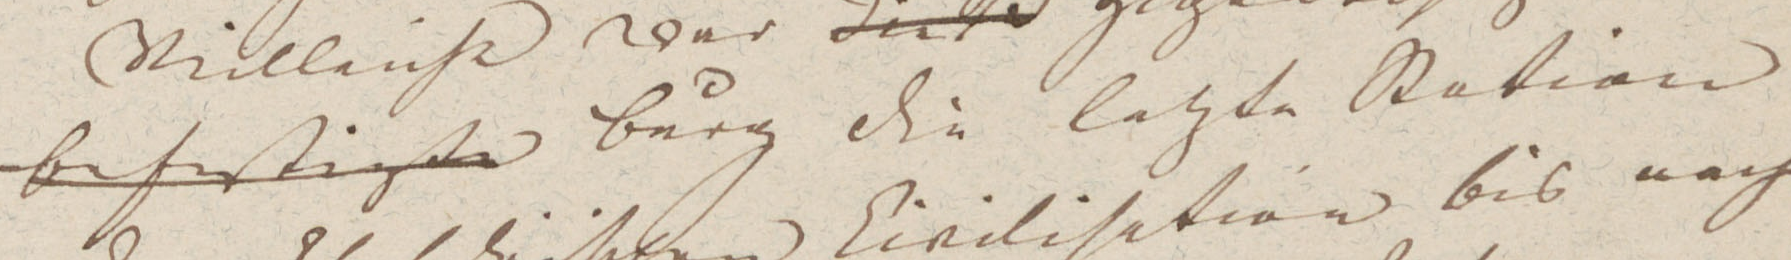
befestigte Burg die letzte Station
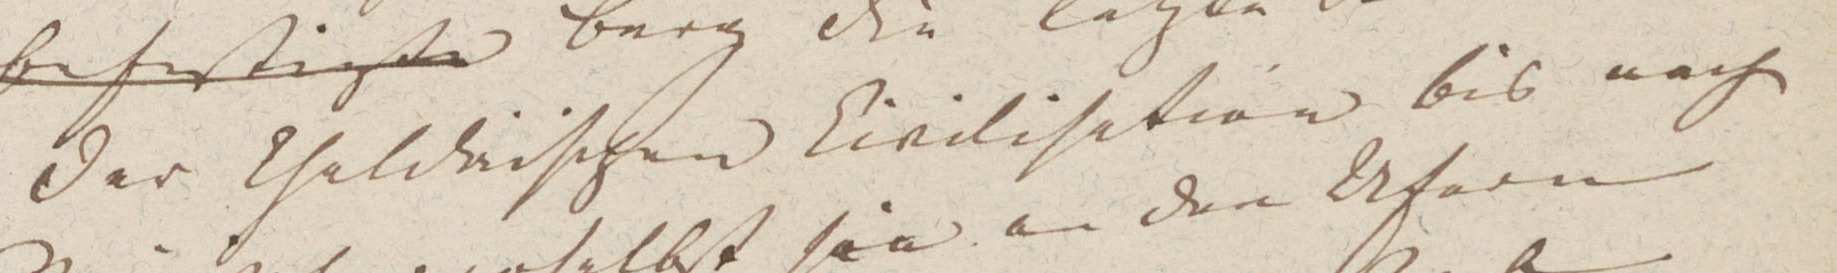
der Chaldäischen Civilisation bis nach
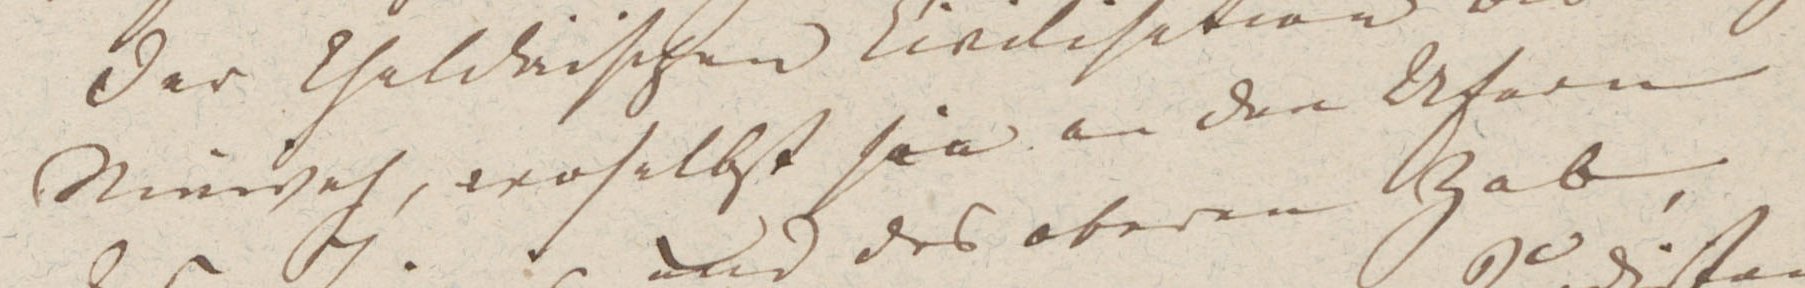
Niniveh, woselbst sie an den Ufern
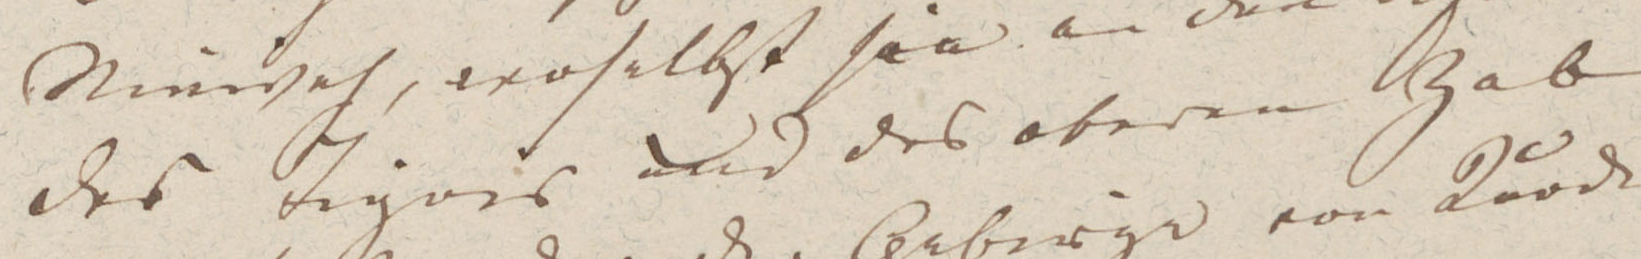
des Tigris und des oberen Zab,
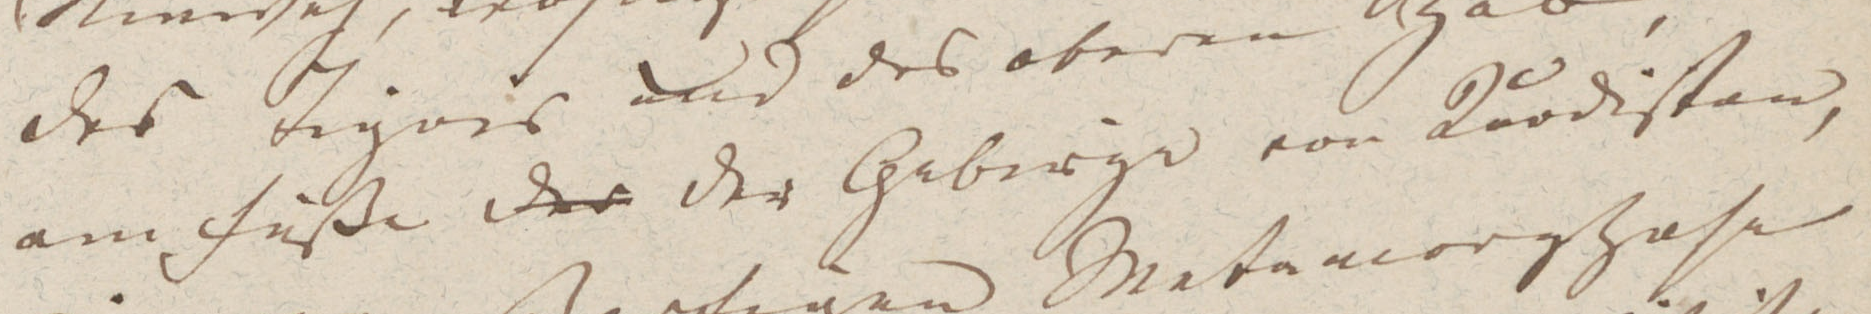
am Fusse der der Gebirge von Kurdistan,
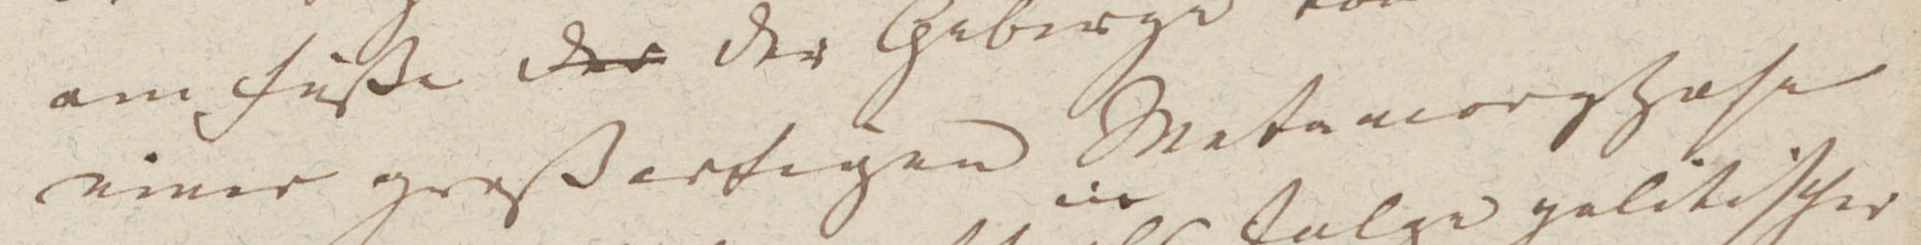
einer grossartigen Metamorphose
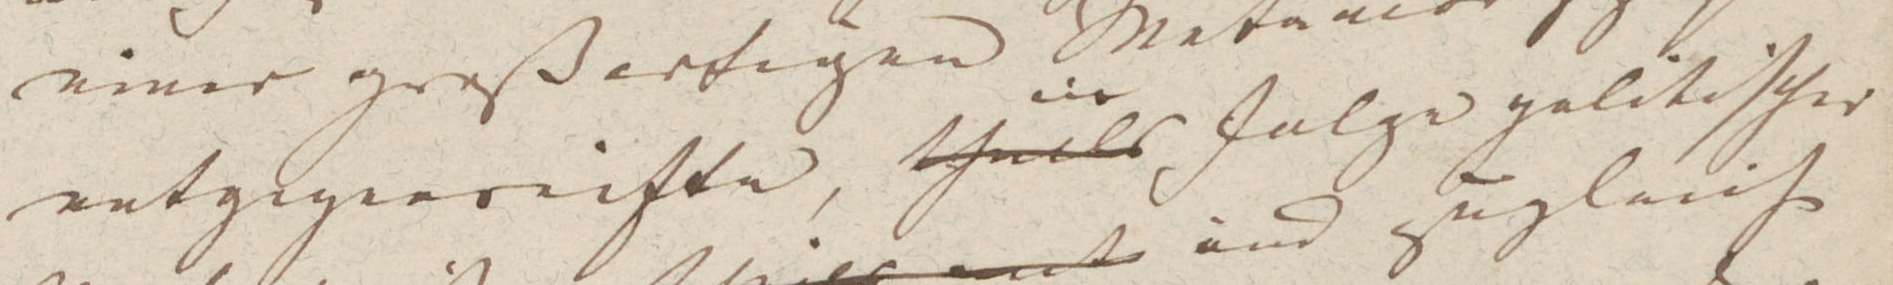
entgegenreifte, theils in Folge politischer
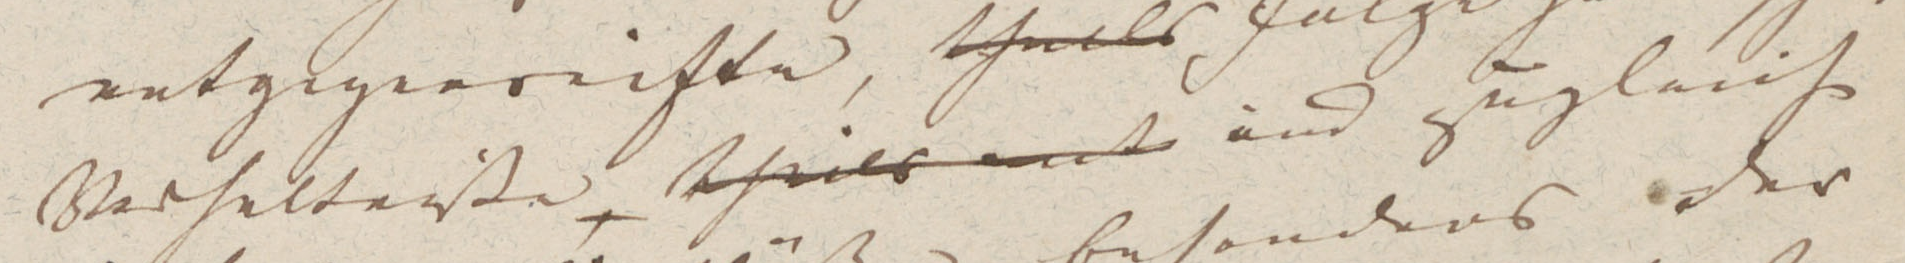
Verhaltnisse, theils mit und zugleich
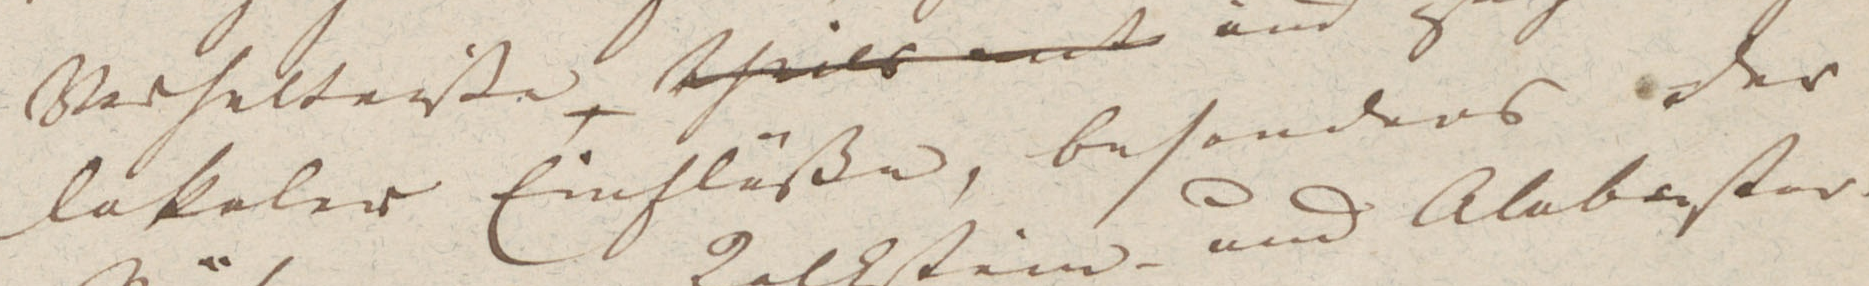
lokaler Einflüsse, besonders der
